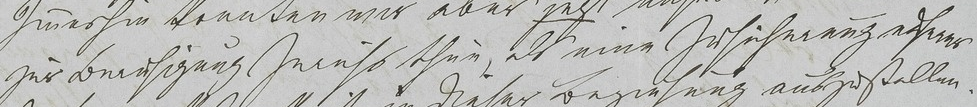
zur Beruhigung Zürichs thun, als eine Zusicherung unserer
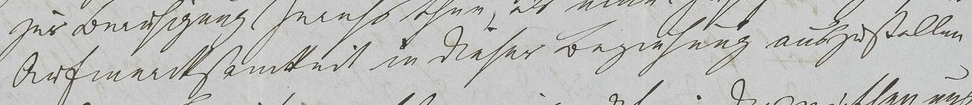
Aufmercksamkeit in dieser Beziehung auszustellen.
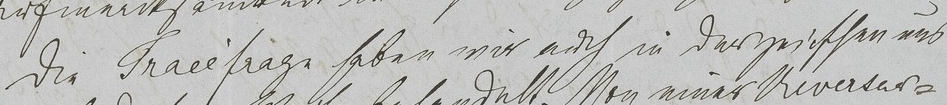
Die Tracéfrage haben wir auch in der zwischen uns
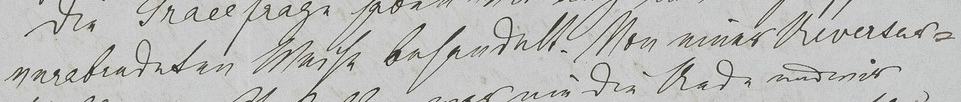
verabredeten Weise behandelt. Von einer Reverser-
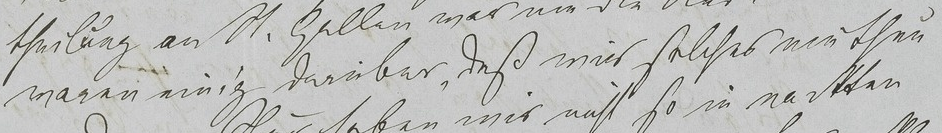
waren einig darüber, daß wir solches nie thun
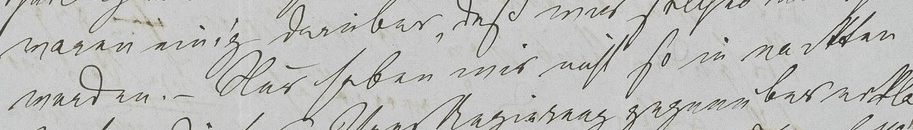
werden. – Nur haben wir nicht so in nackten
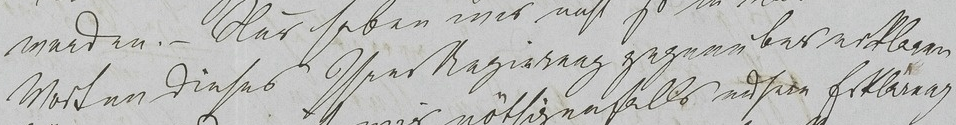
Worten dieses Ihrer Regierung gegenüber erklären
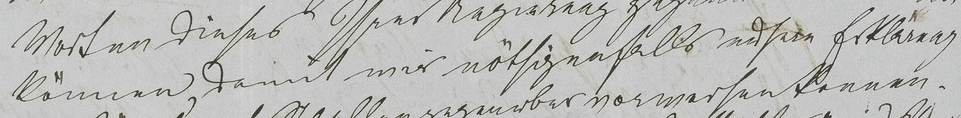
können, damit wir nöthigenfalls unsere Erklärung
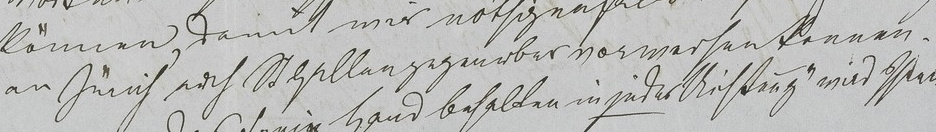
an Zürich auch St Gallen gegenüber vorweisen können.
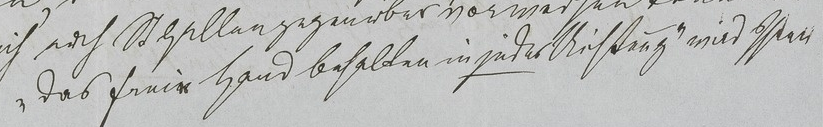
«Das freie Hand behalten in jeder Richtung» wird Ihnen
